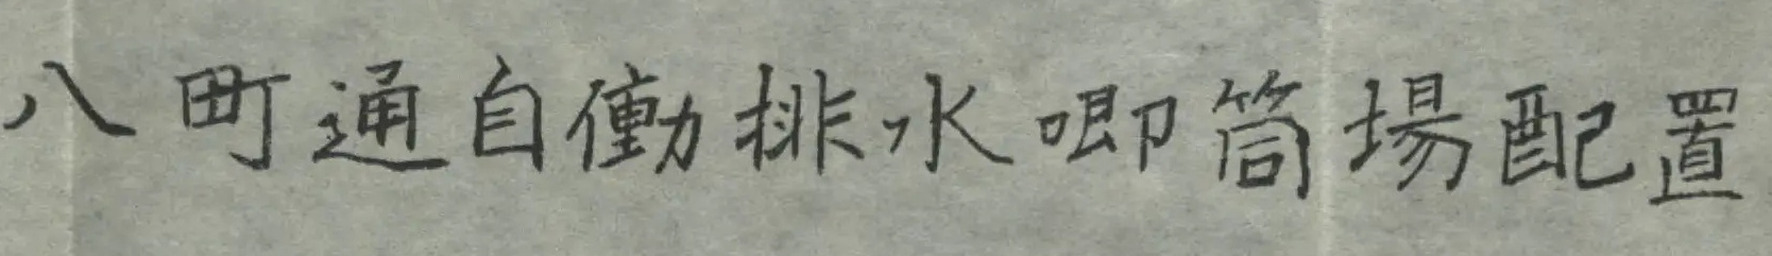八町通自働排水唧筒場配置図

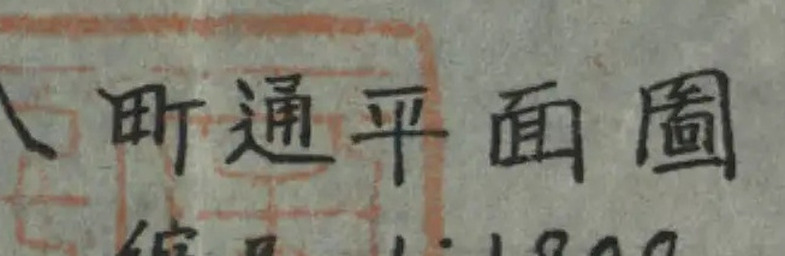八町通平面図
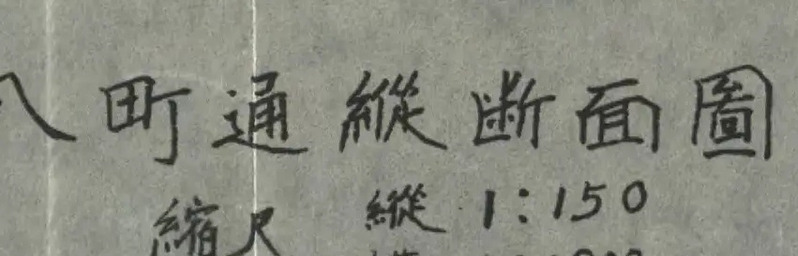八町通縦断面図
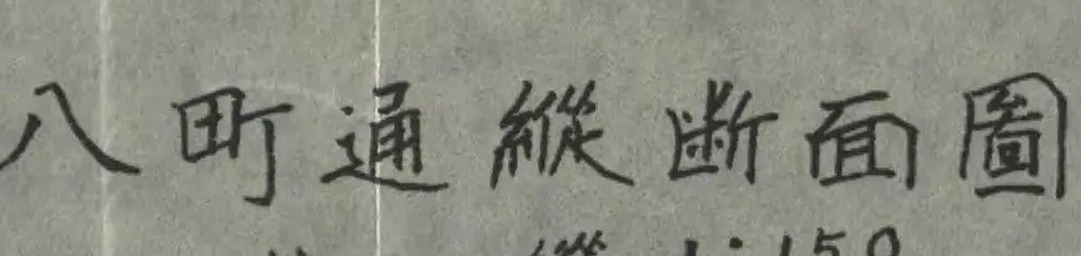八町通縦断面図

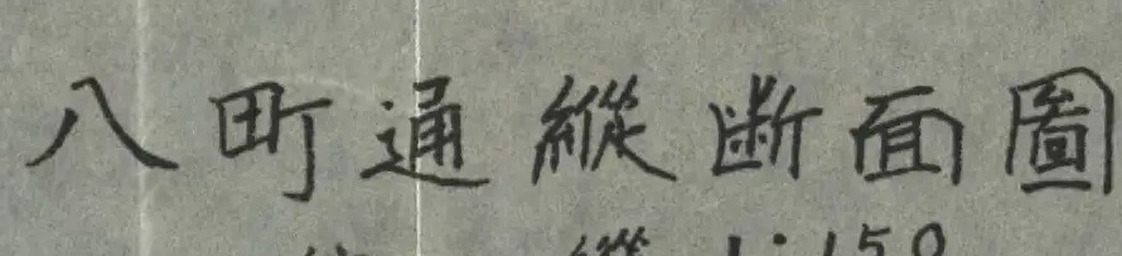八町通縦断面図
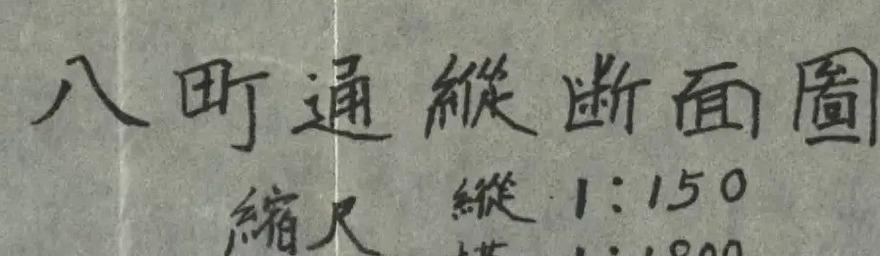八町通縦断面図

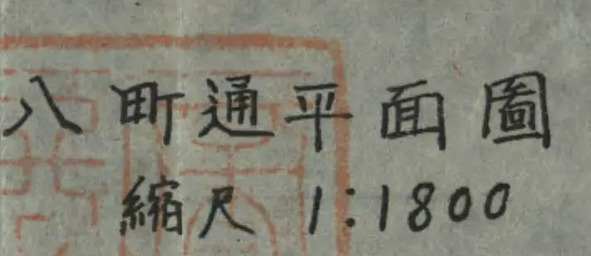八町通平面図
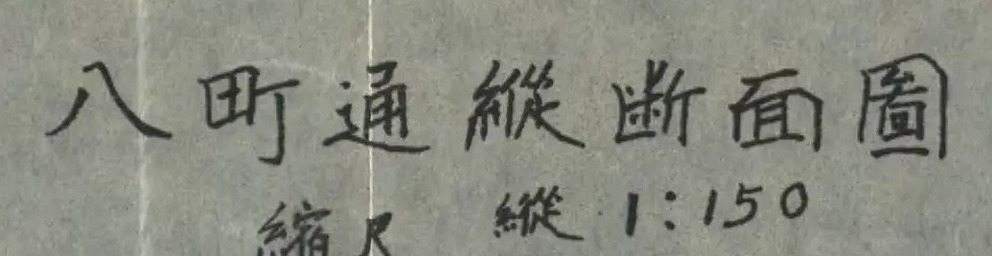八町通縦断面図

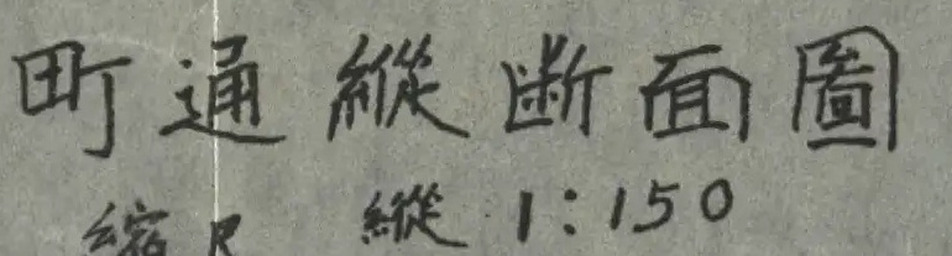八町通縦断面図
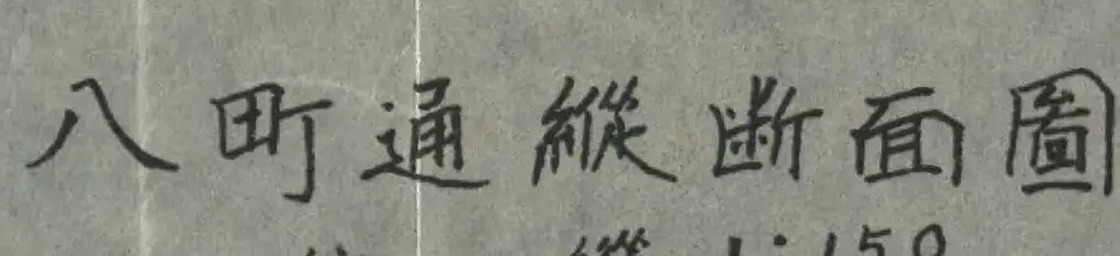八町通縦断面図
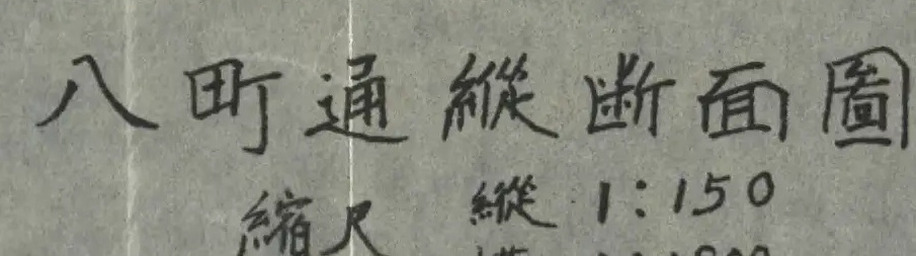八町通縦断面図

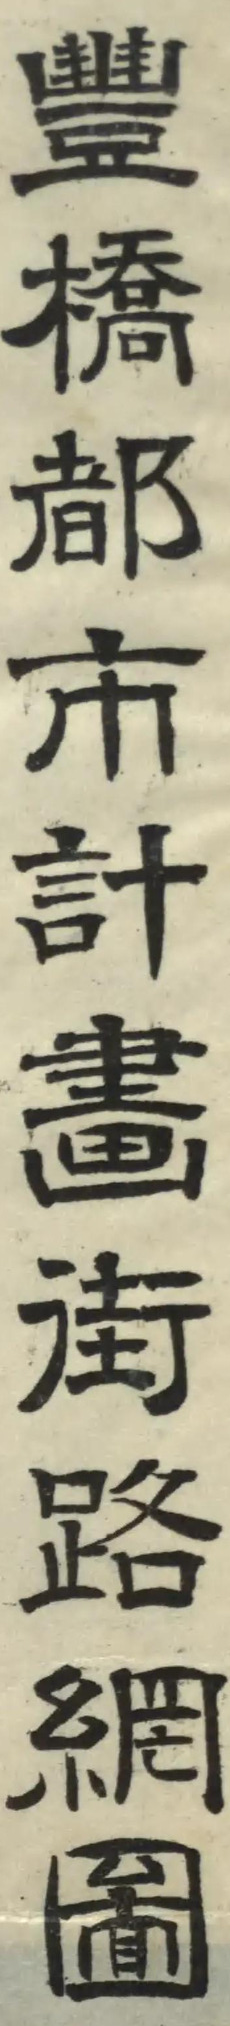豊橋都市計画街路網図
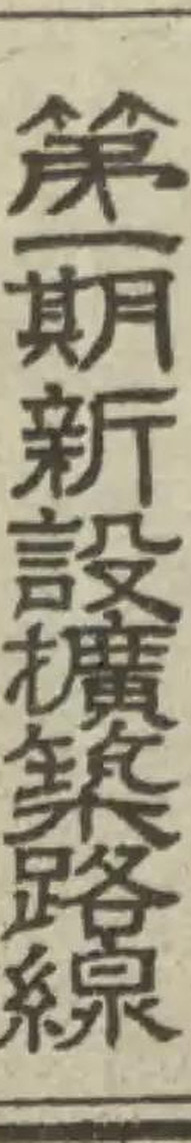第一期新設拡築路線
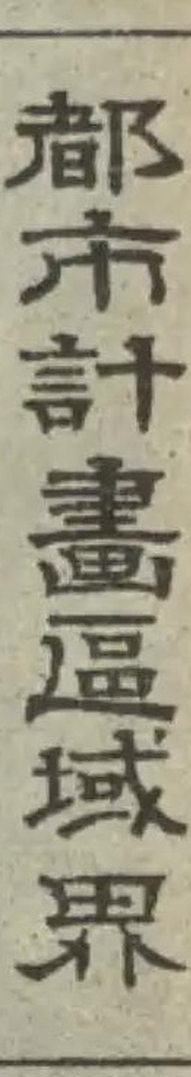都市計画区域界

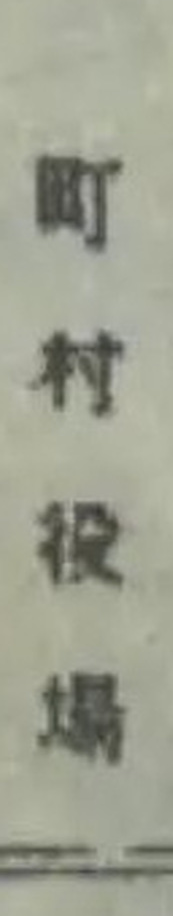町村役場
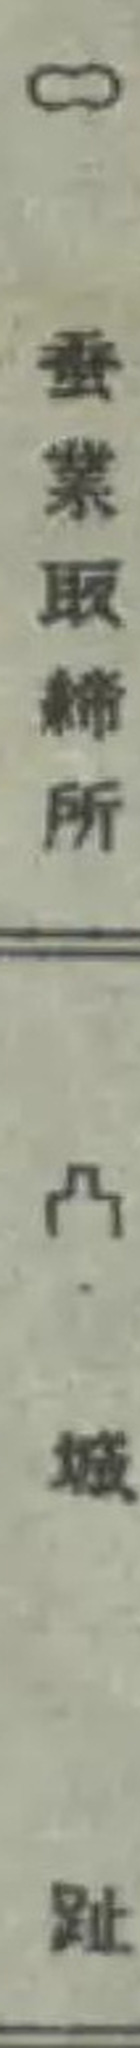蚕業取締所
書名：豊橋市都市計画第一期事業報告書
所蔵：国立国会図書館 National Diet Library, JAPAN
